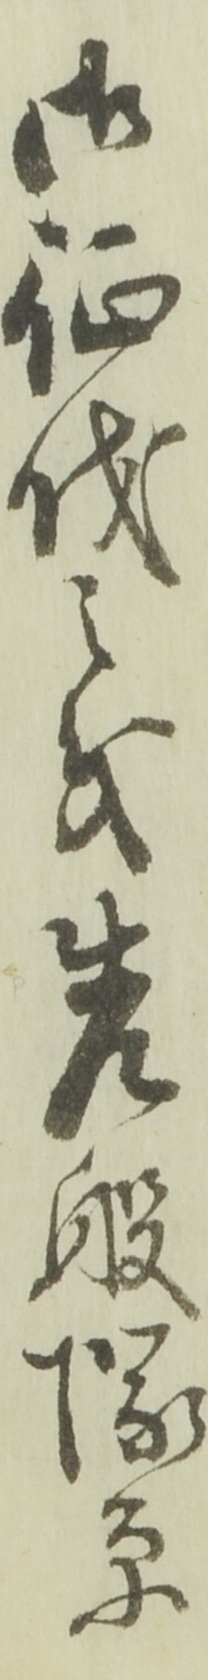御征伐之義先般塚原
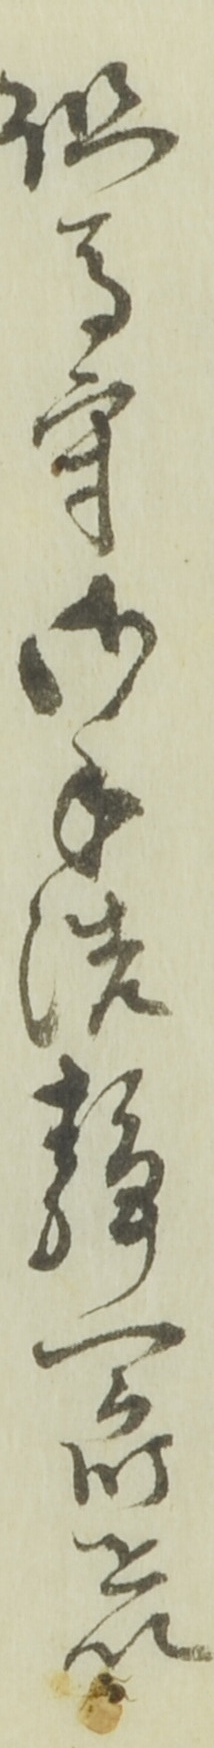但馬守御手洗静一郎を以
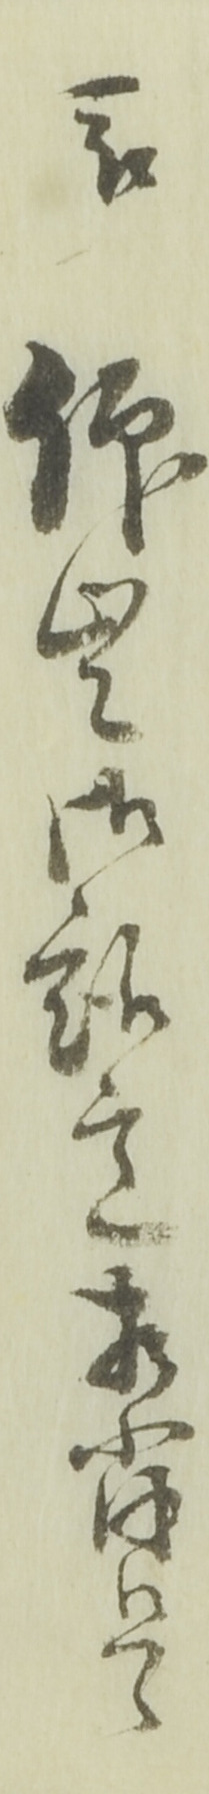被仰出御趣意相背候ハゝ
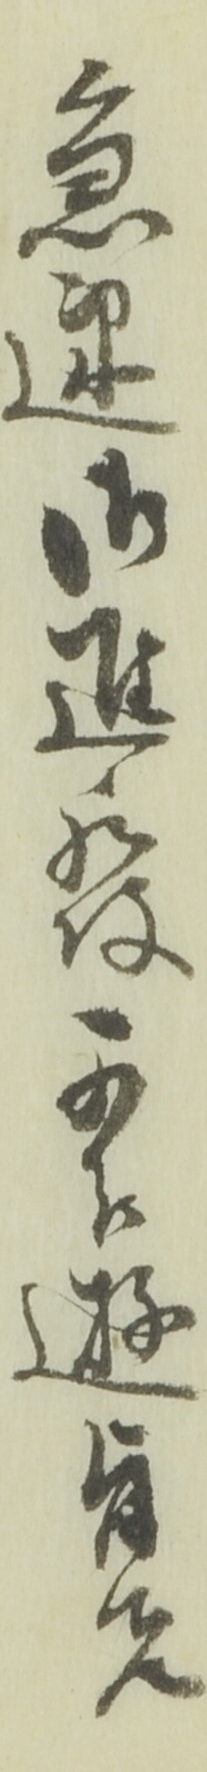急速御進発可被遊旨先
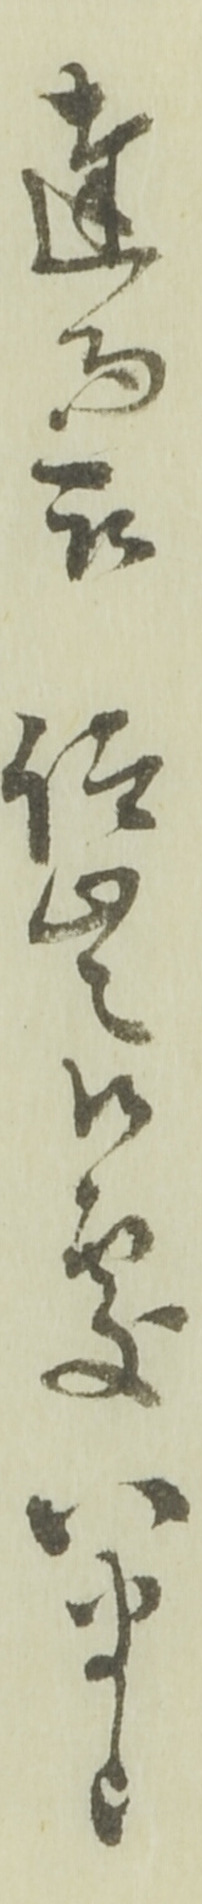達而被仰出候処いまた
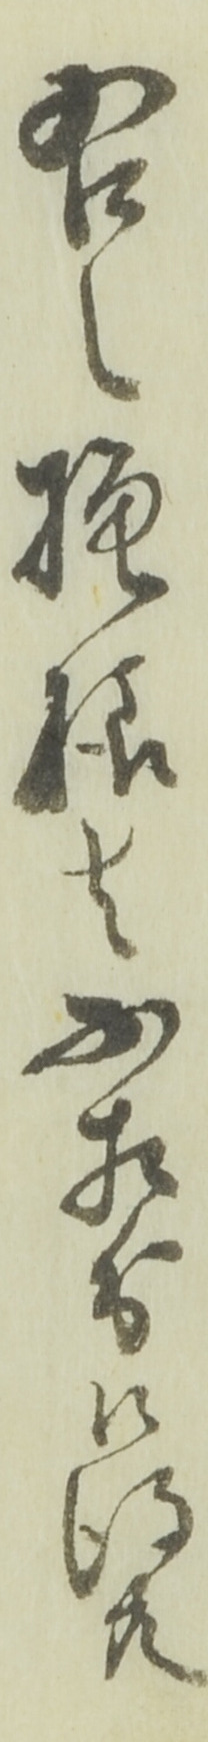右之模様者不相分候得共
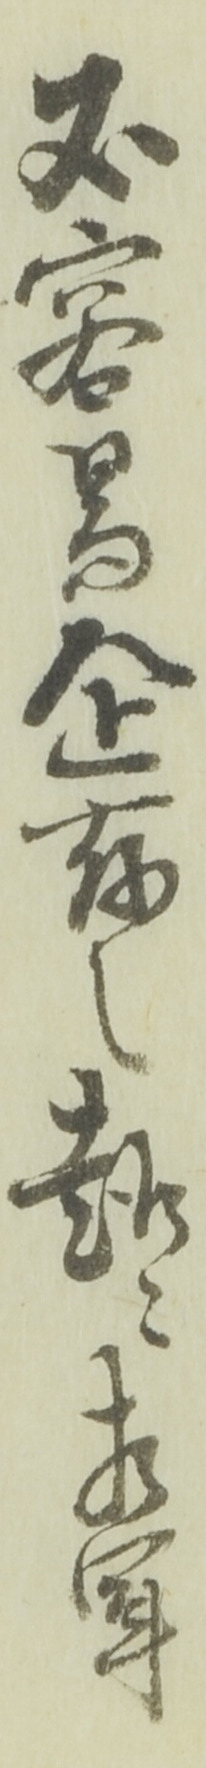不容易企存之趣ニ相聞
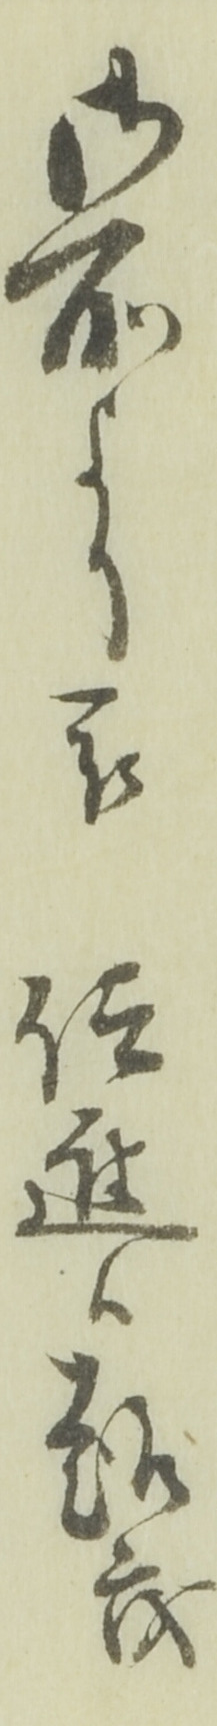御所より被注進候趣茂
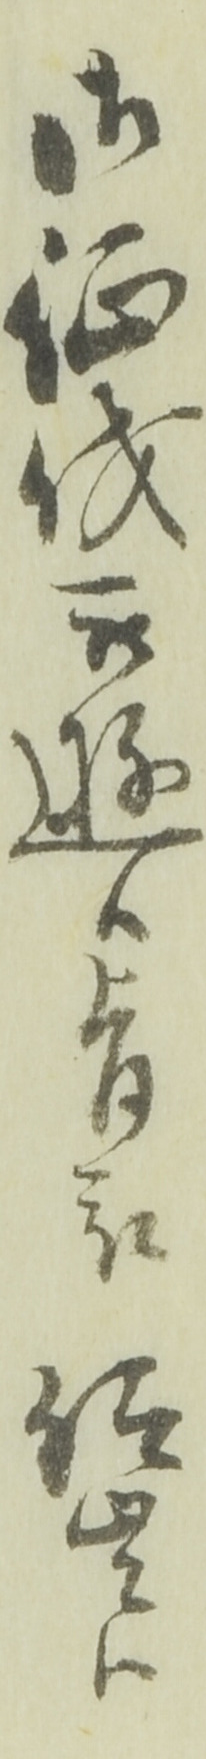御征伐被遊候旨被仰出候
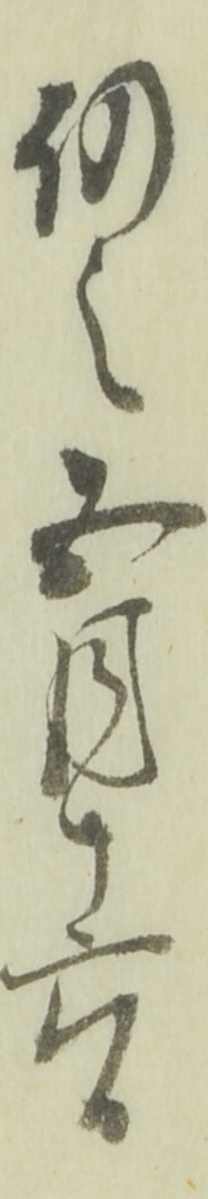仍之五月十六日

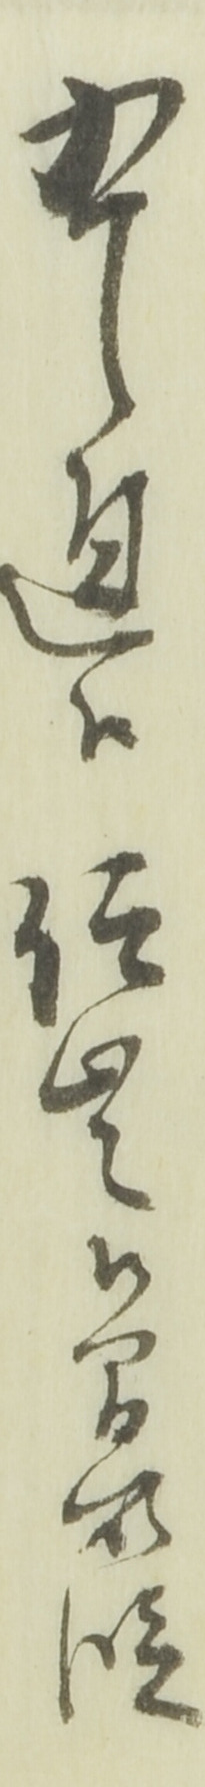右之通被仰出候間此段
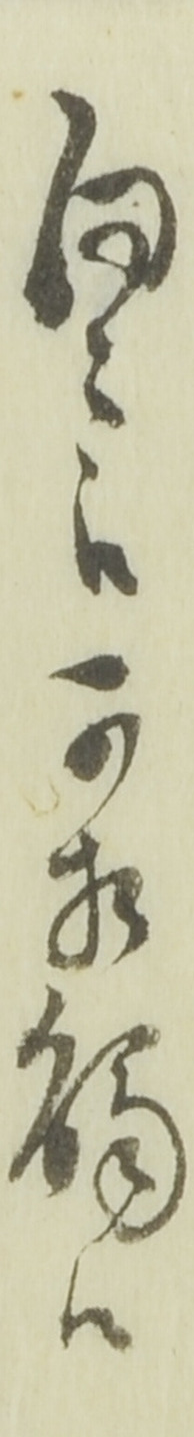向々江可相触候
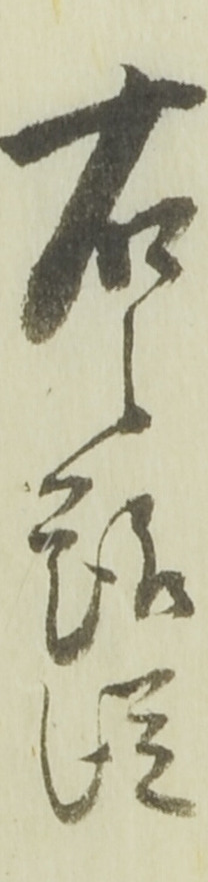右之趣従
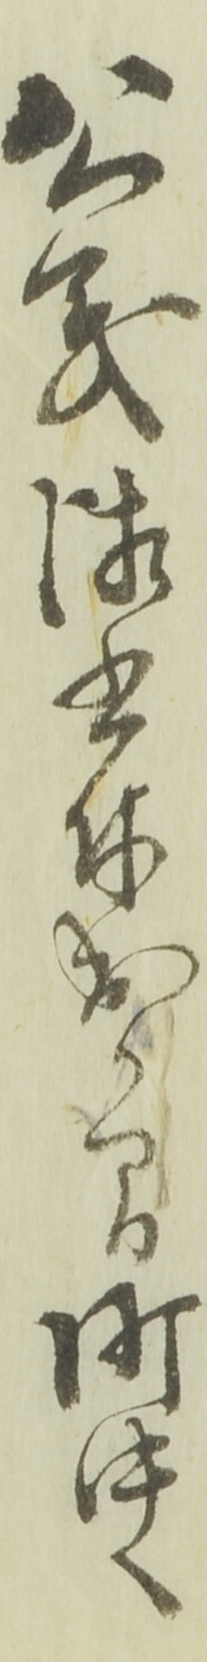公義御書付出候間町中へ
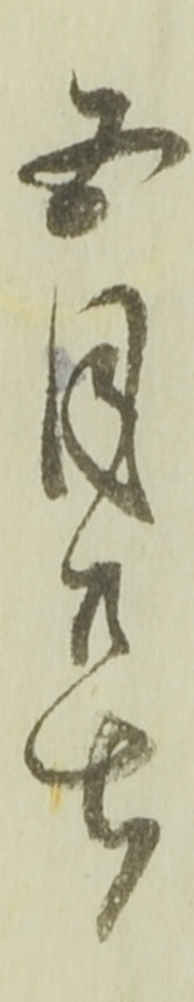五月廿七日
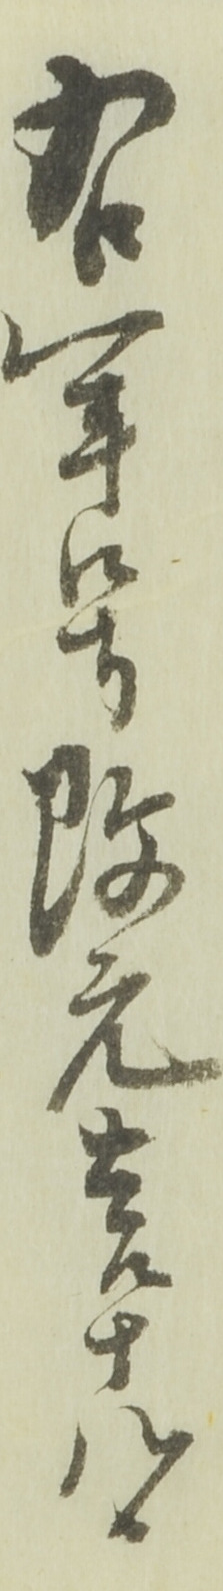右年号改元去ル十八日
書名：御触書御書附控帳
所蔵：伊那市立高遠町図書館・合同会社AMANE
